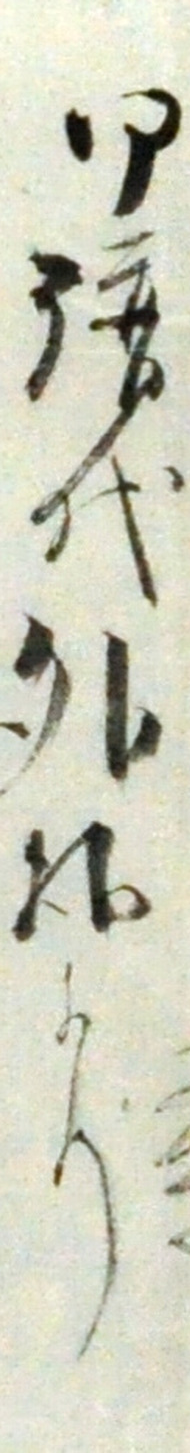御譜代外様より
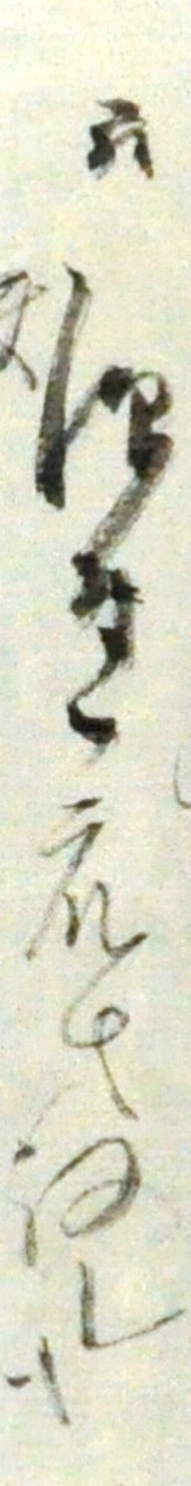被仰付候衆は何レも
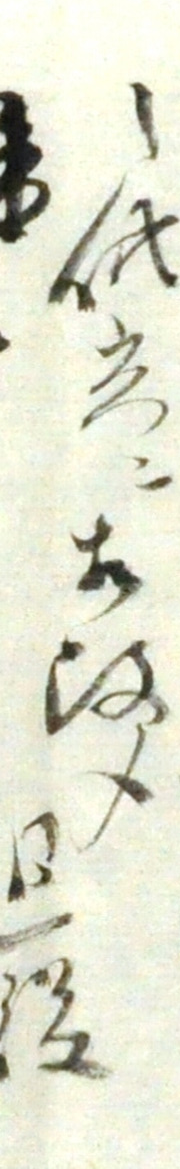之供立に相改メ退役
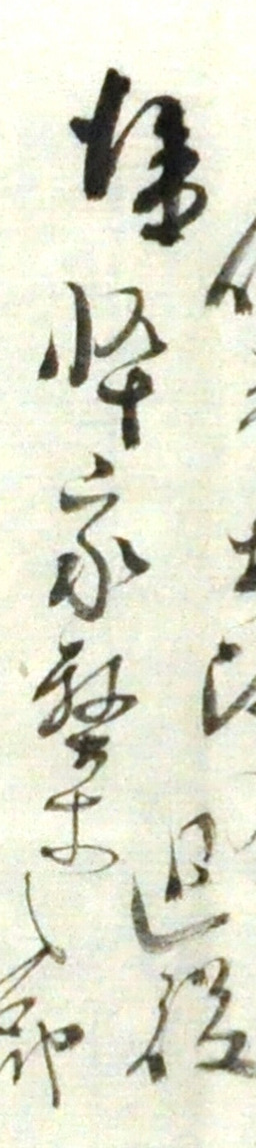後悴家督等之節
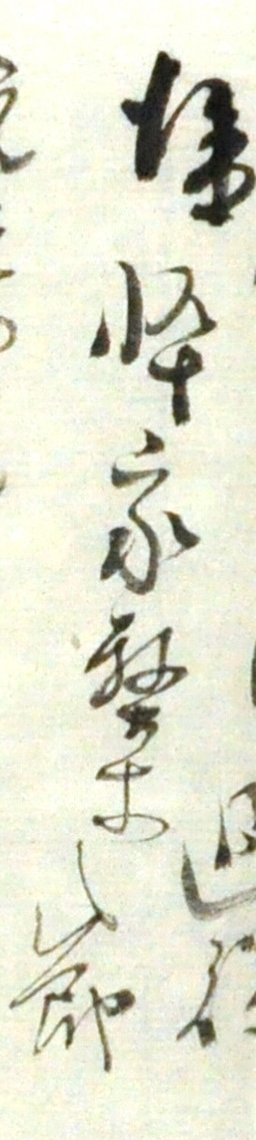後悴家督等之節
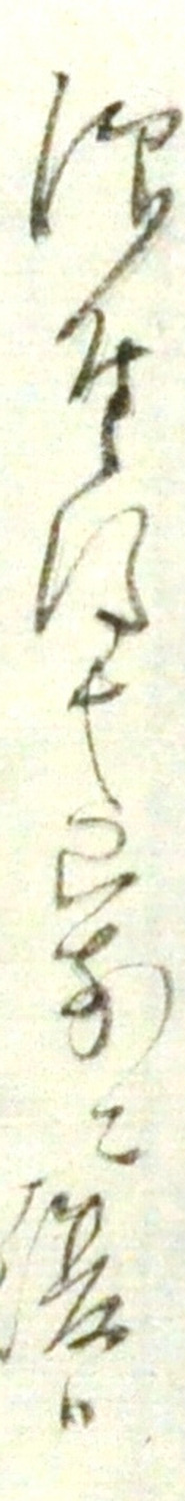仰付候得は已前に復候
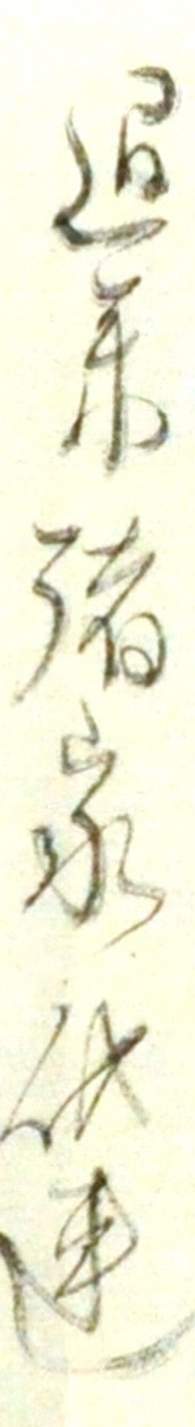退参諸家供連
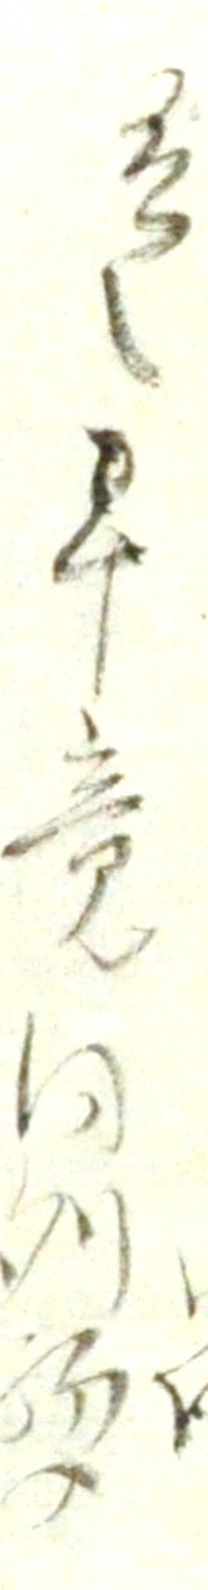有之畢竟同列初メ
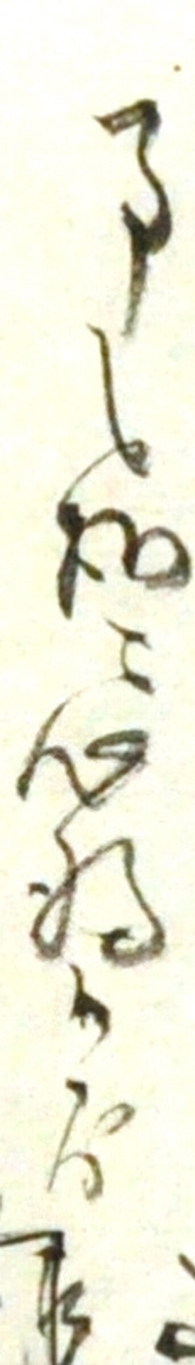事之様に心得候ゟ

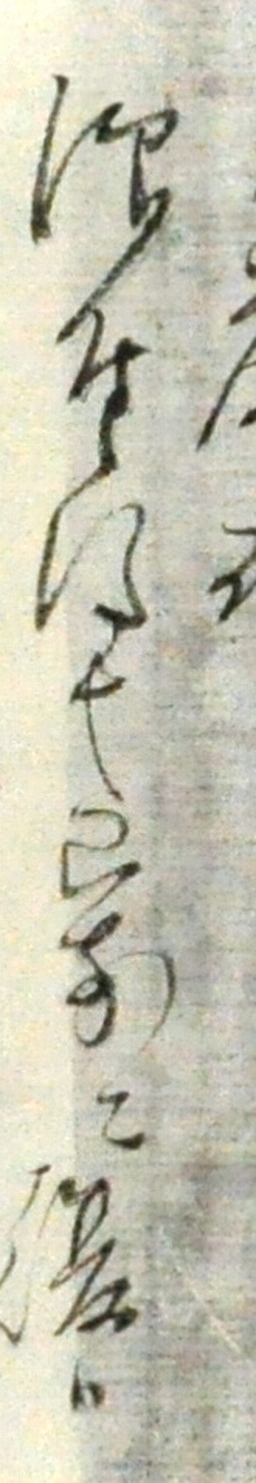仰付候得は已前に復候
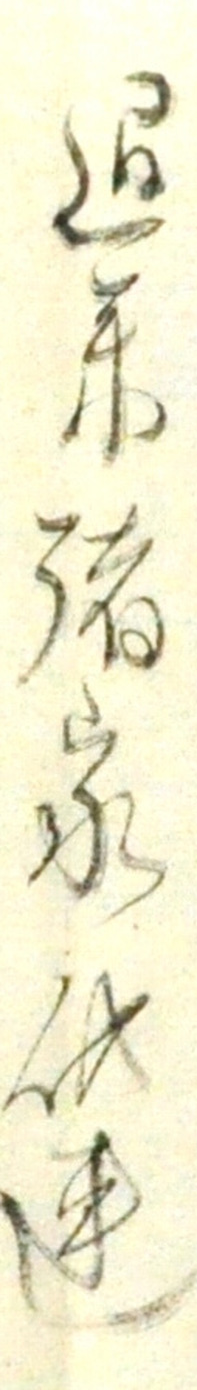退参諸家供連
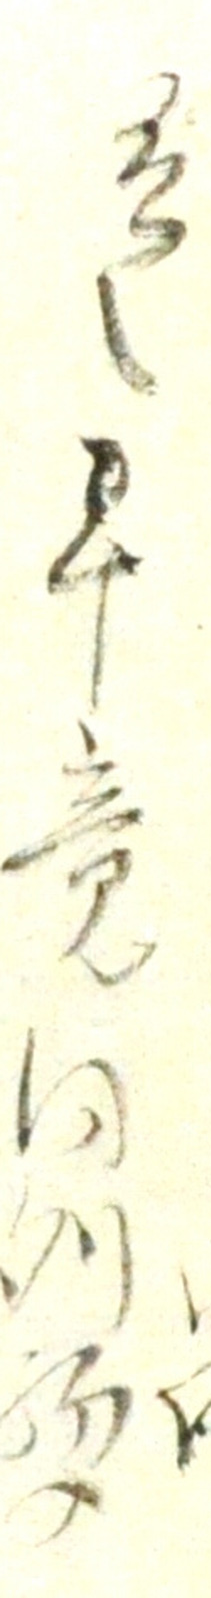有之畢竟同列初メ
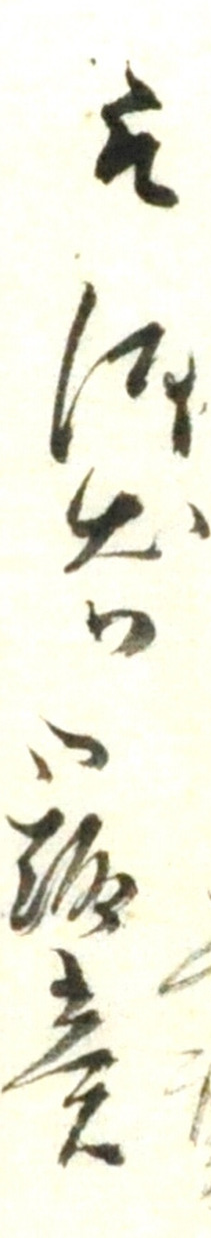被仰出候御趣意
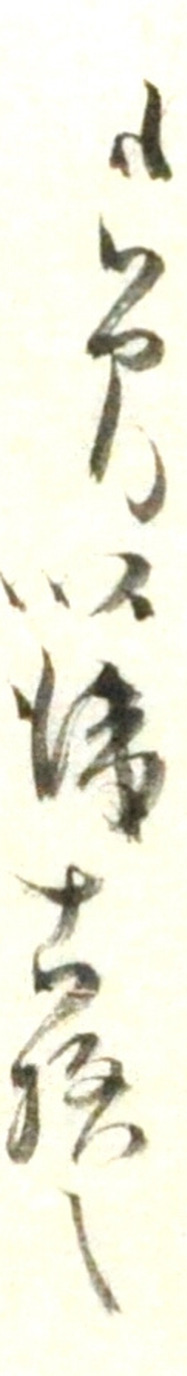も候間以後古格之
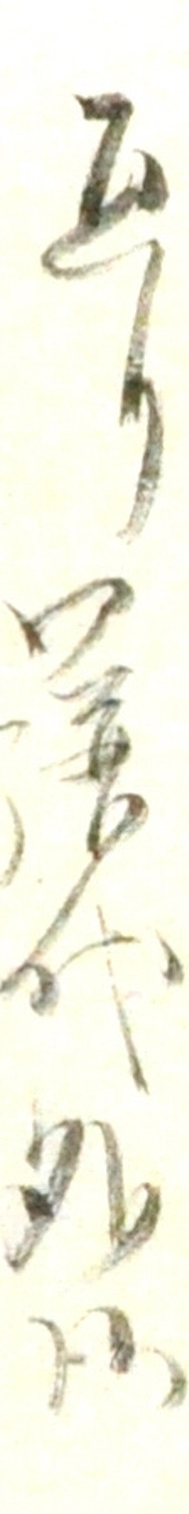通り御譜代外様
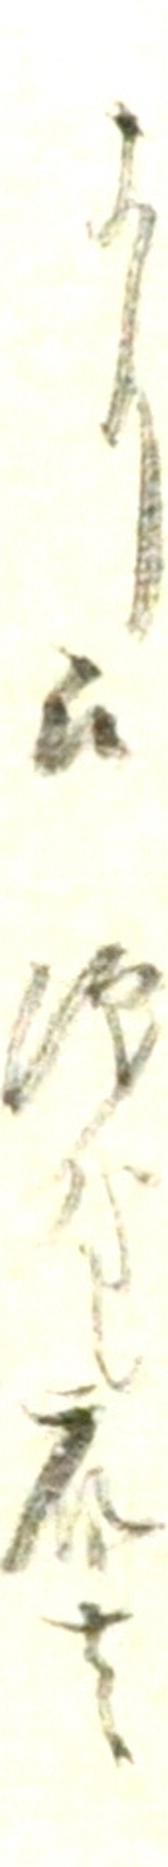より被仰付候衆は
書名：申合書付
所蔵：伊那市立高遠町図書館・合同会社AMANE
